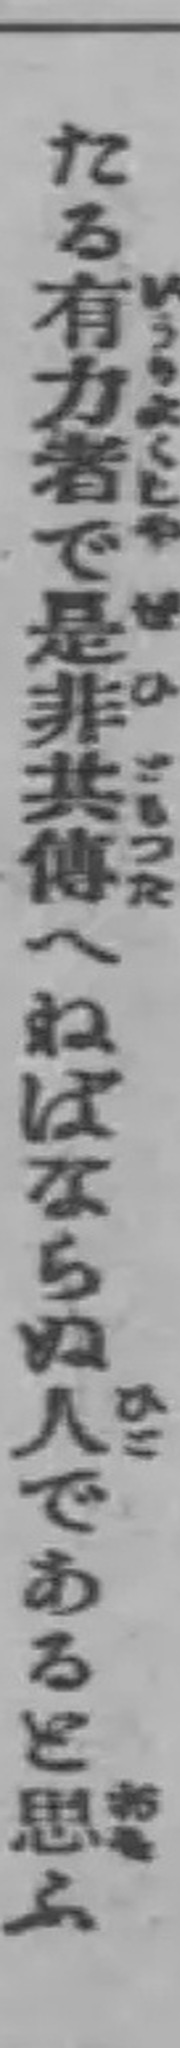たる有力者で是非共伝へねばならぬ人であると思ふ
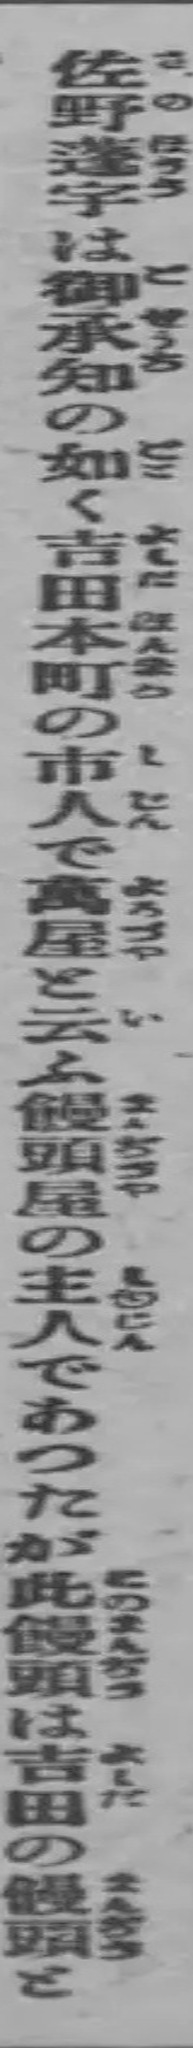佐野蓬宇佐野蓬宇は御承知の如く吉田本町の市人で萬屋と云ふ饅頭屋の主人であつたが此饅頭は吉田の饅頭と
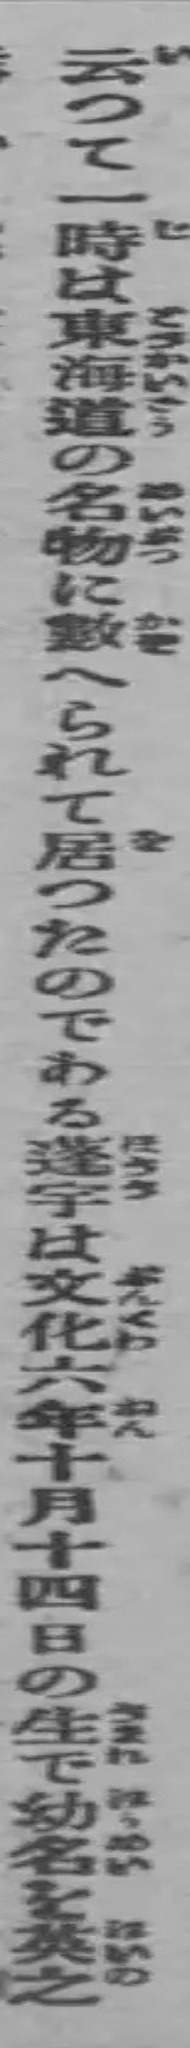云つて一時は東海道の名物に数へられて居つたのである蓬宇は文化六年十月十四日の生で幼名を英之
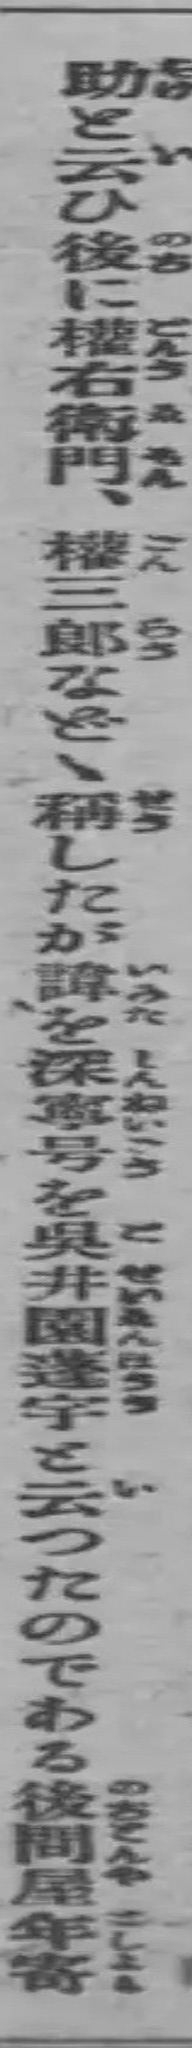助と云ひ後に権右衛門、権三郎などゝ称したが諱を深寧号を呉井園蓬宇と云つたのである後問屋年寄
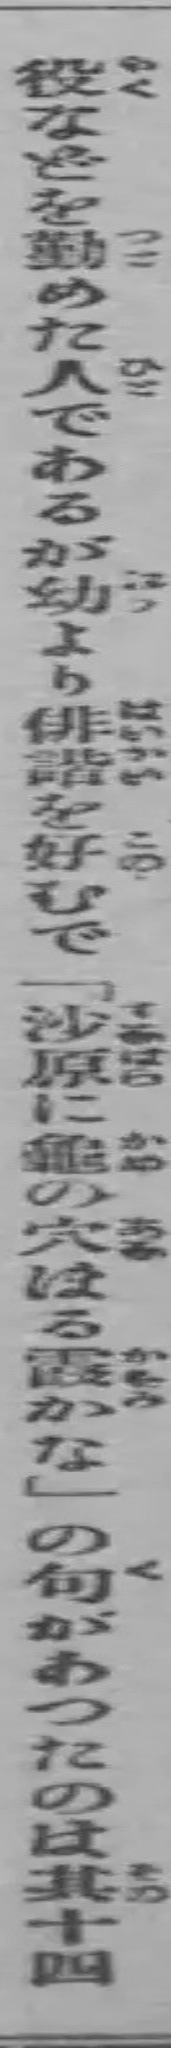役などを勤めた人であるが幼より俳諧を好むで「沙原に亀の穴ほる霞かな」の句があつたのは其十四
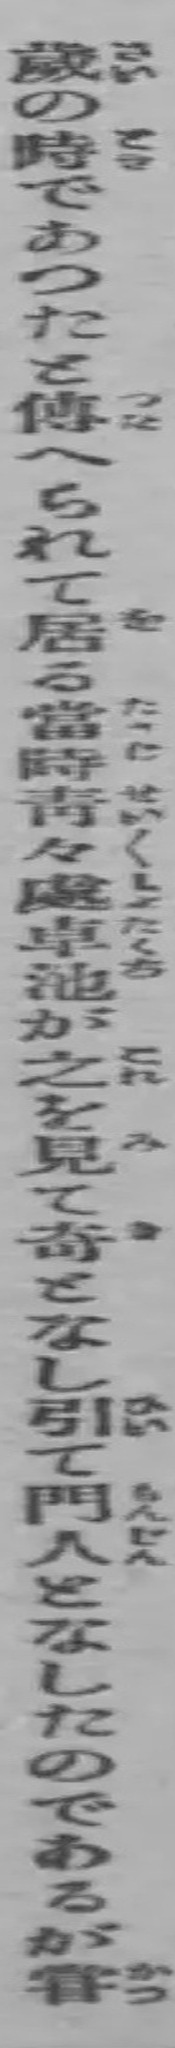歳の時であつたと伝へられて居る当時青々処卓池が之を見て奇となし引て門人となしたのであるが嘗
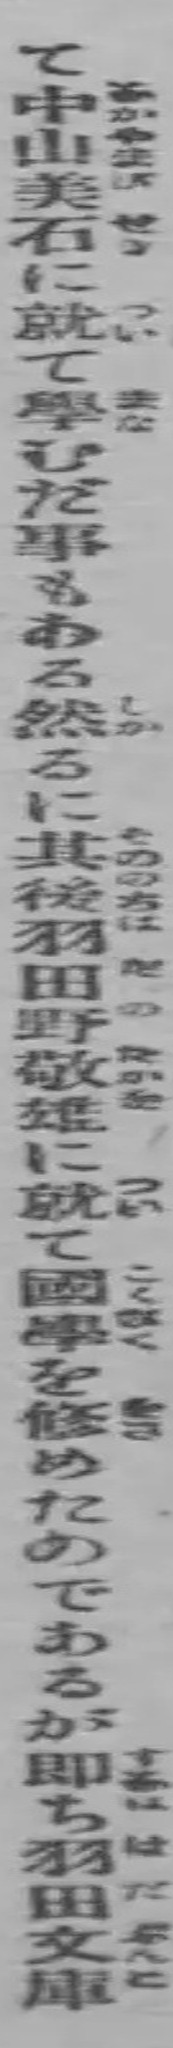て中山美石に就て学むだ事もある然るに其後羽田野敬雄に就て国学を修めたのであるが即ち羽田文庫
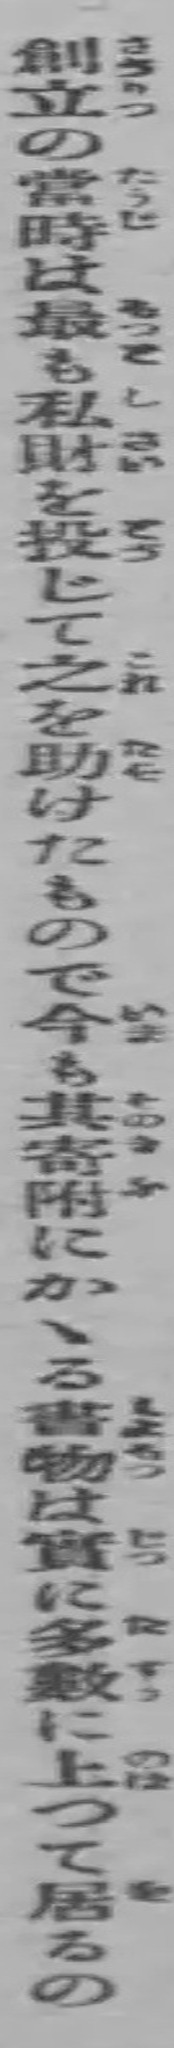創立の当時は最も私財を投じて之を助けたもので今も其寄附にかゝる書物は実に多数に上つて居るの
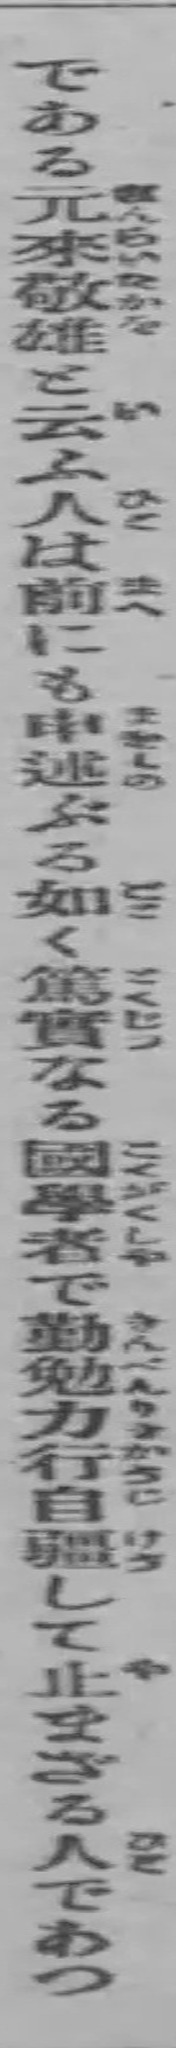である元来敬雄と云ふ人は前にも申述ぶる如く篤実なる国学者で勤勉力行自彊して止まざる人であつ
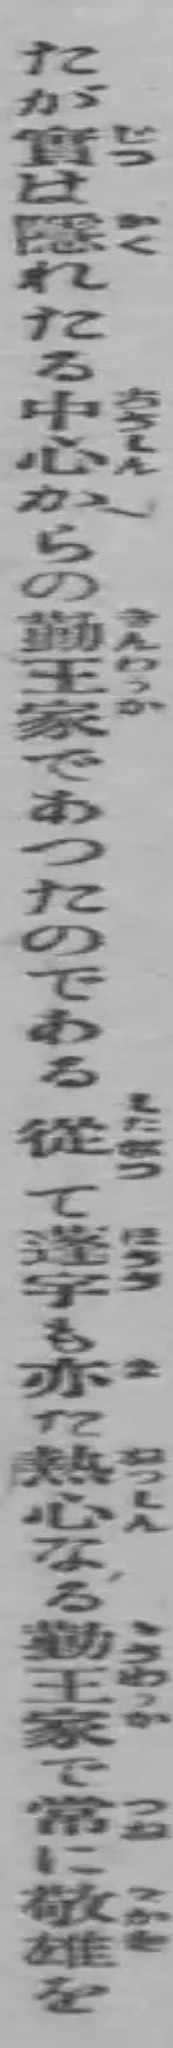敬雄と志士たが実は隠れたる中心からの勤王家であつたのである従て蓬宇も亦た熱心なる勤王家で常に敬雄を
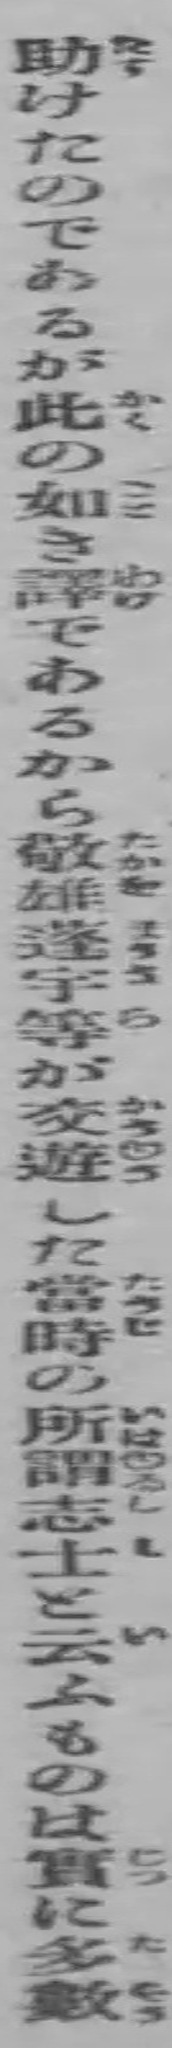助たのであるが此の如き訳であるから敬雄蓬宇等が交遊した当時の所謂志士と云ふものは実に多数
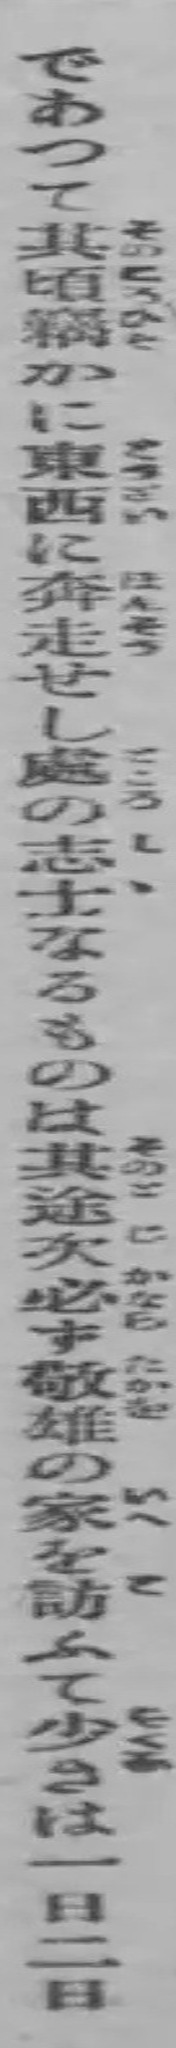であつて其頃竊かに東西に奔走せし処の志士なるものは其途次必ず敬雄の家を訪ふて少きは一日二日
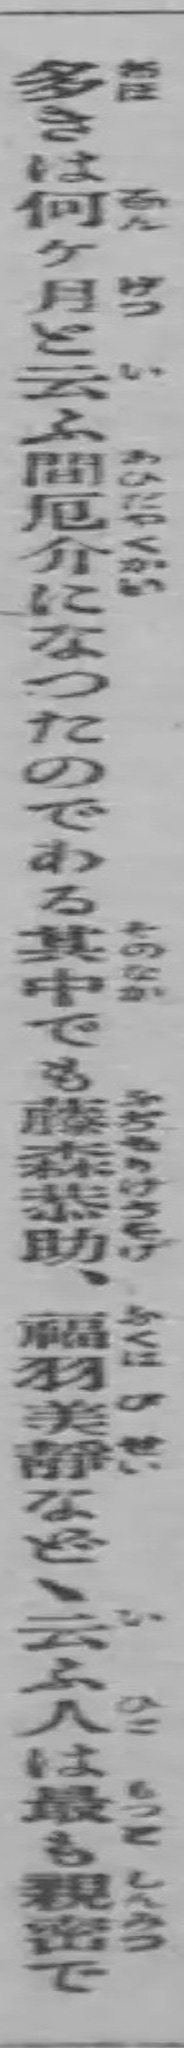多きは何ケ月と云ふ間厄介になつたのである其中でも藤森恭助、福羽美静などゝ云ふ人は最も親密で
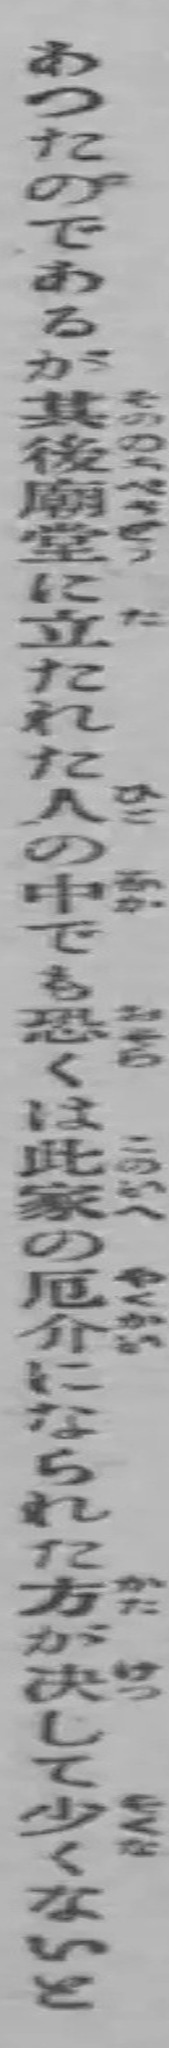あつたのであるが其後廟堂に立たれた人の中でも恐くは此家の厄介になられた方が決して少くないと
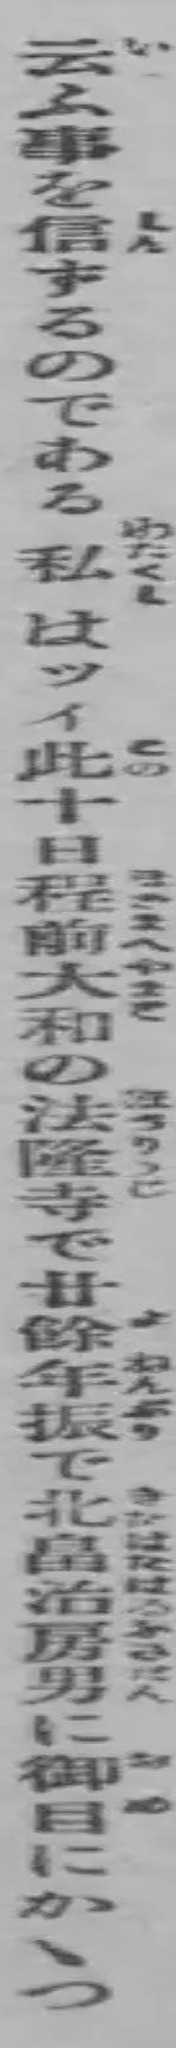云ふ事を信ずるのである私はツイ此十日程前大和の法隆寺で廿余年振で北畠治房男に御目にかゝつ
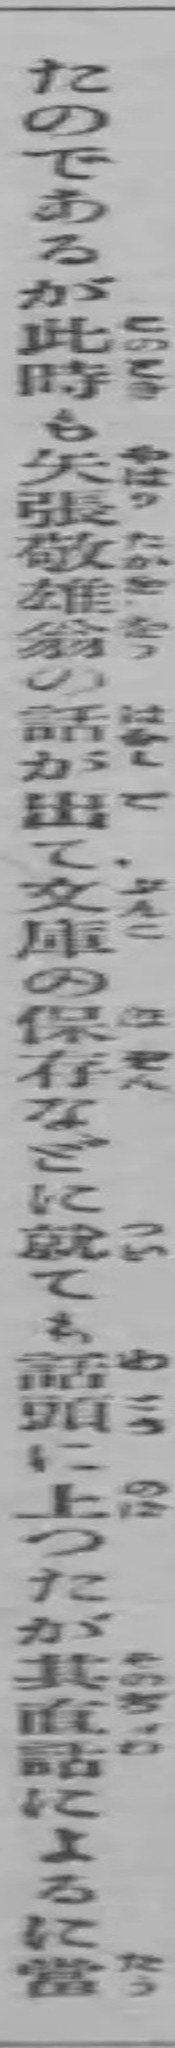たのであるが此時も矢張敬雄翁の話が出て文庫の保存などに就ても話頭に上つたが其直話によるに当
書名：豊橋市史談
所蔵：国立国会図書館 National Diet Library, JAPAN
